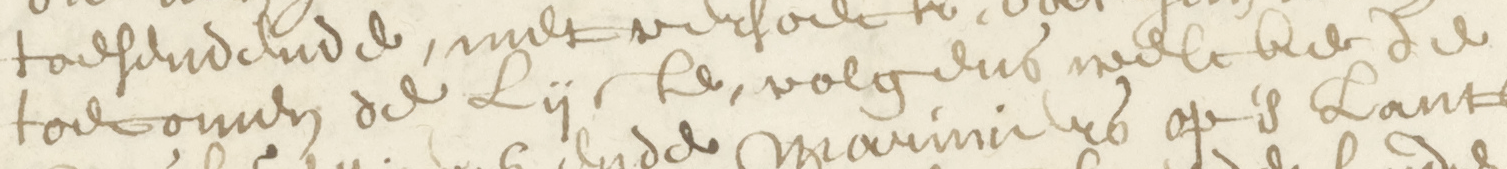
toecomen de Lijste, volgens welcke de
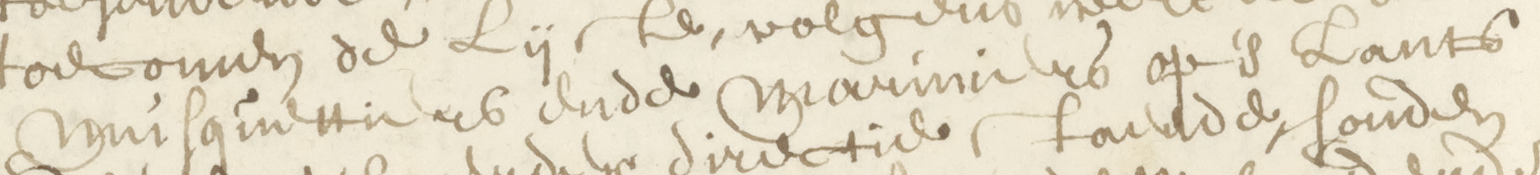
musquettiers ende mariniers op 's Lants
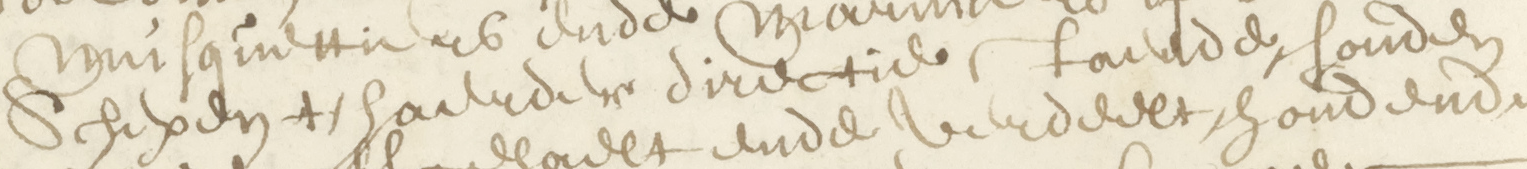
Schepen t‛haerder directie staende, souden
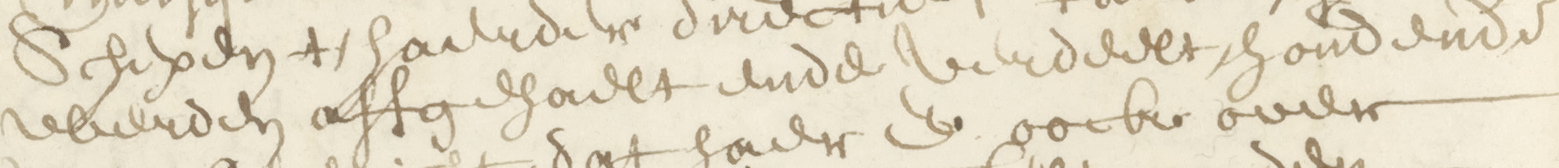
werden affgehaelt ende verdeelt, houdende
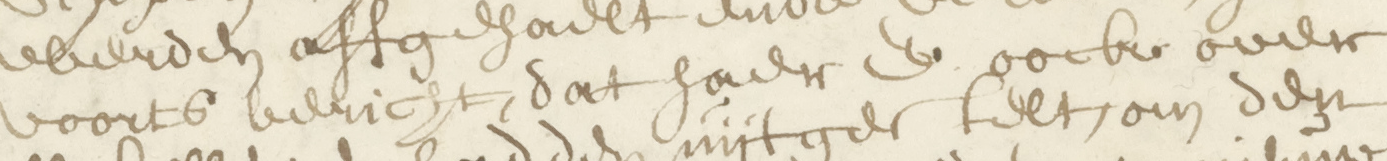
voorts bericht, dat haer E. oock over
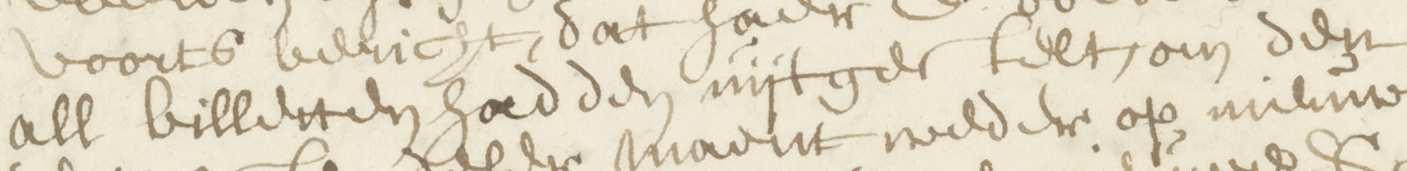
all billetten hadden uijtgestelt, om den
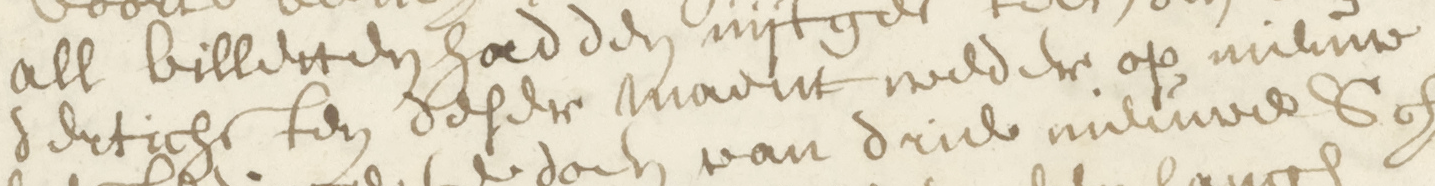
dertichsten deser maent weder op nieuw
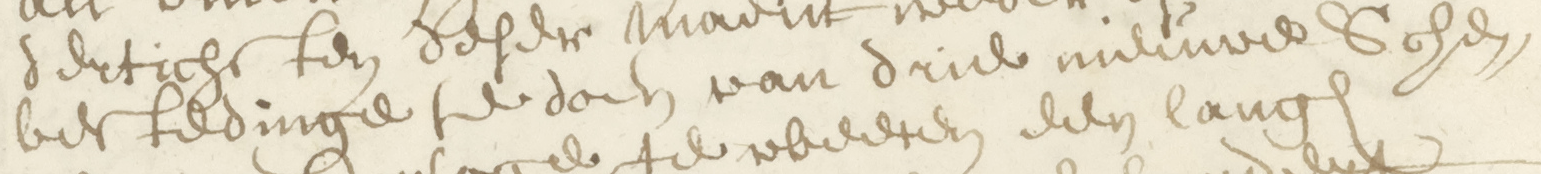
bestedinge te doen van drie nieuwe Sche,,
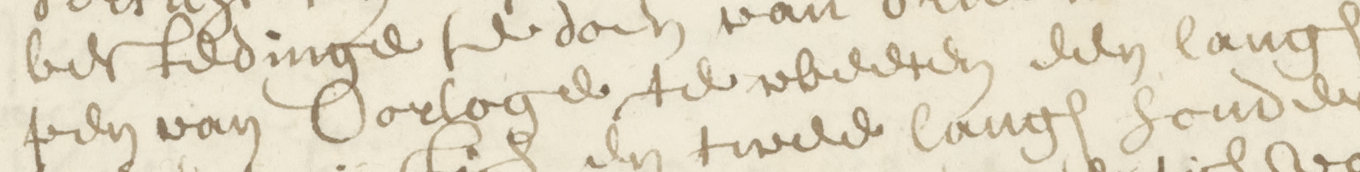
pen van Oorloge, te weeten een langh
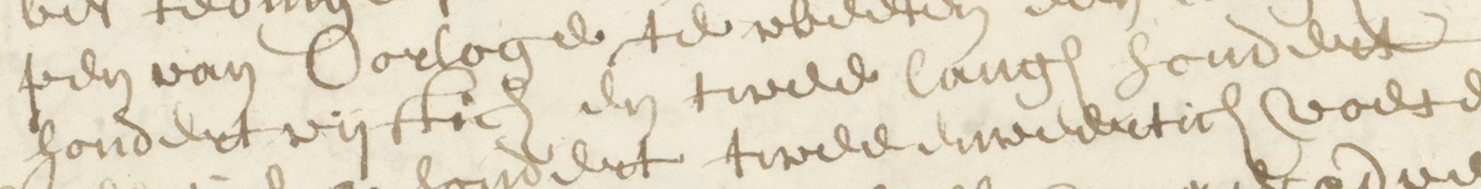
hondert vijftich en twee langh hondert
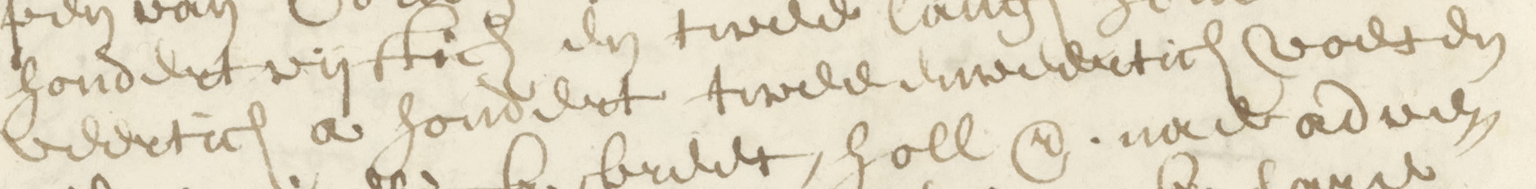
veertich a hondert twee enveertich voeten
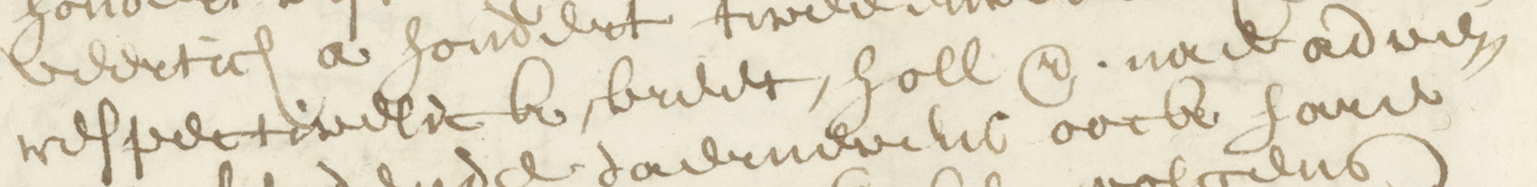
respectivelick, breet, holl &. nae adve„
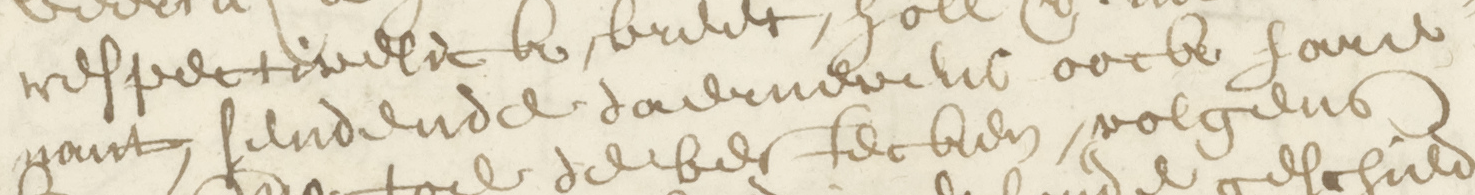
nant, sendende daernevens oock hare
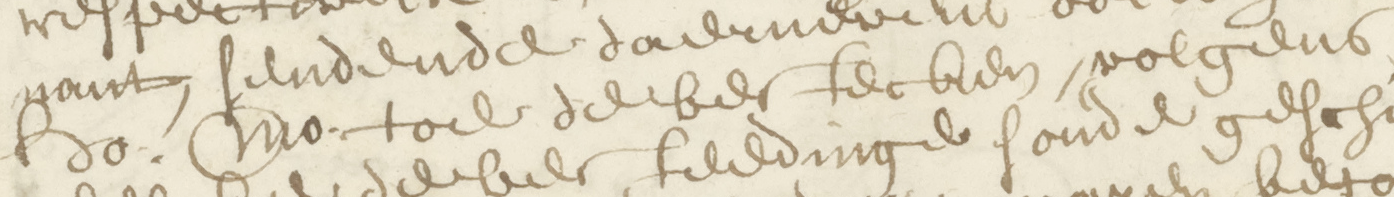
Ho:Mo: toe de bestecken, volgens
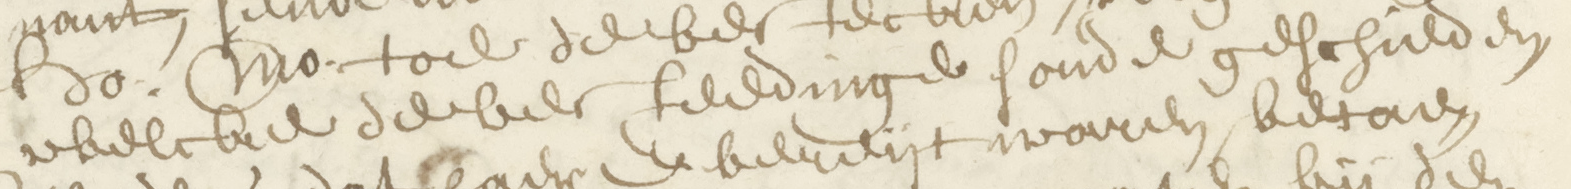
welcke de besteedinge soude geschieden,
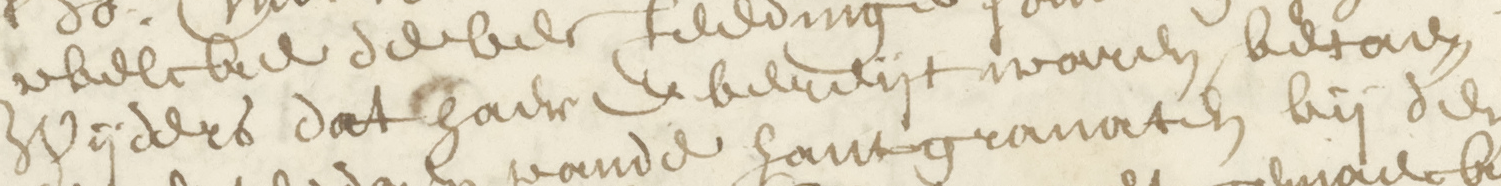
Wijders dat haer E bereijt waren, betae„
